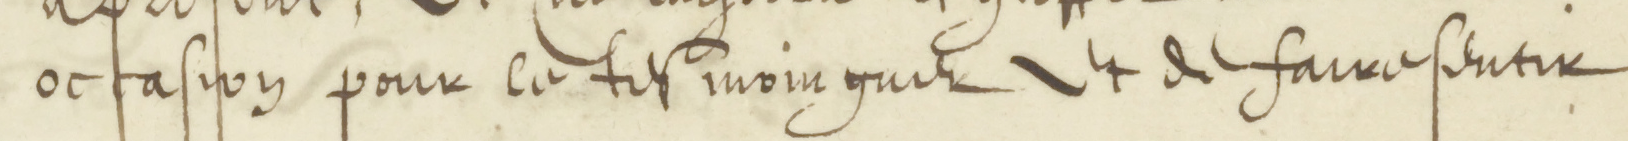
occasion pour le tesmonigner et de faire sentir
